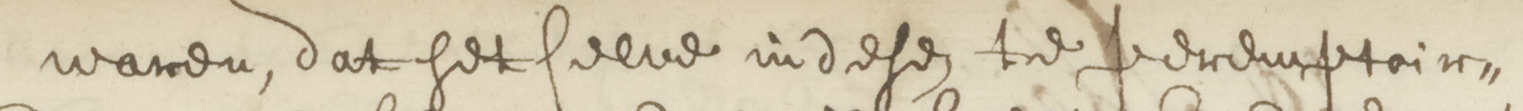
waren, dat het selve in desen te peremptoir„
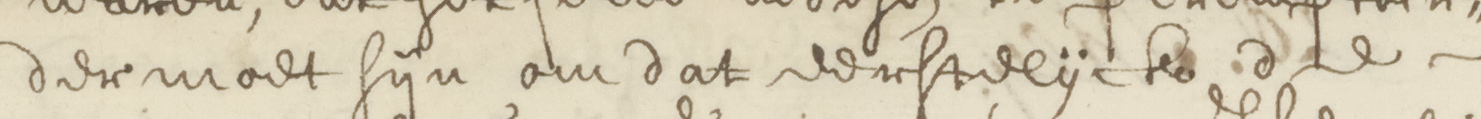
der moet sijn om dat eerstelijck de
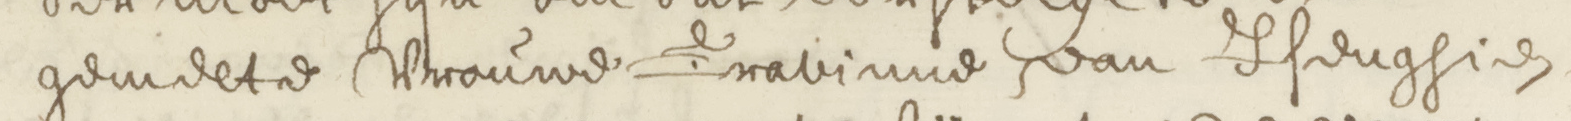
gemelte Vrouwe Gravinne van Isenghien
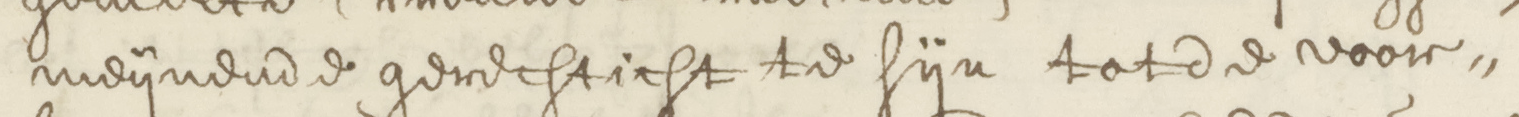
meijnende gerechticht te sijn tot de voor„
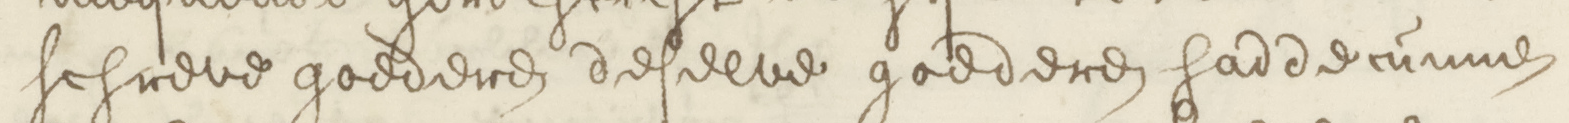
schreve goederen deselve goederen hadde cunnen
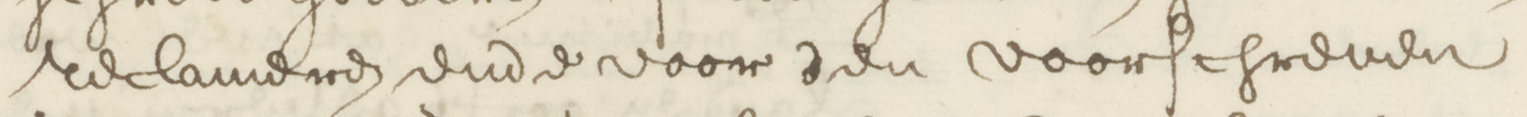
reclameren ende voor den voorschreven
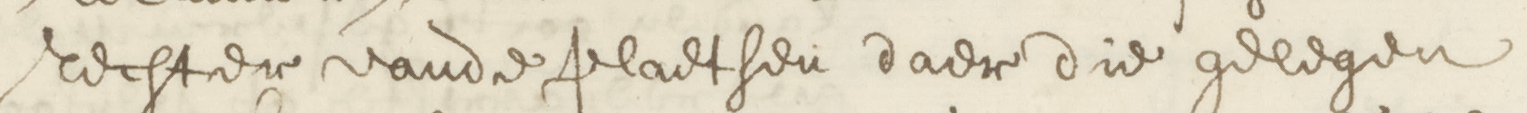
rechter vande plaetsen daer die gelegen
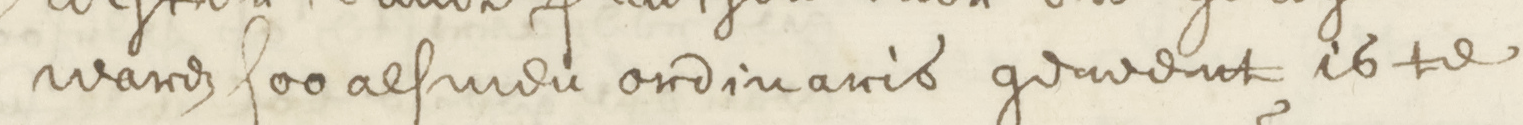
waren soo alsmen ordinaris gewent is te
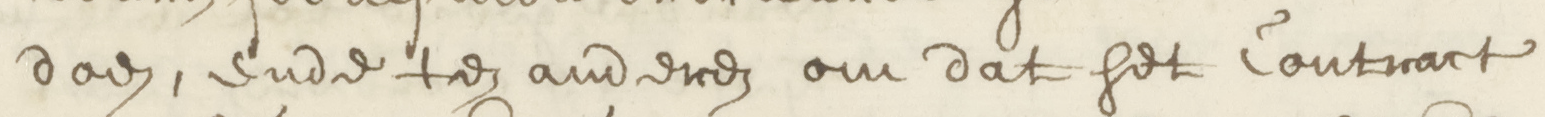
doen, ende ten anderen om dat het Contract
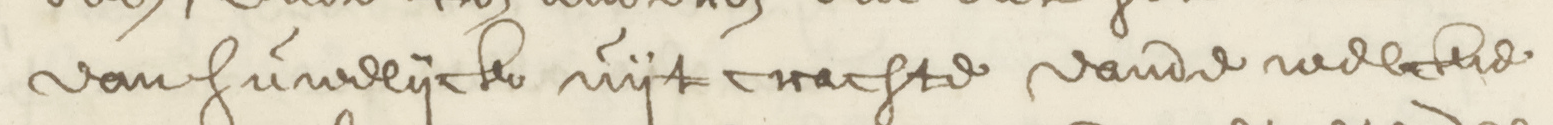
van huwelijck uijt crachte vande welcke
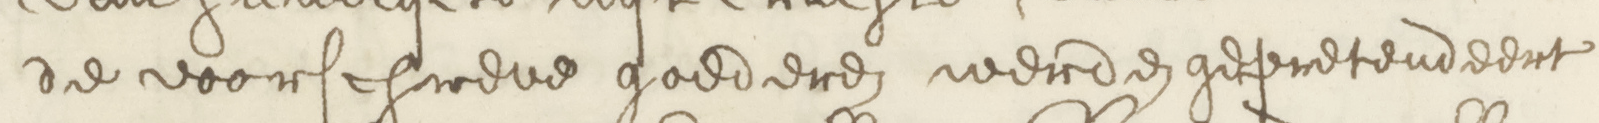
de voorschreve goederen werden gepretendeert
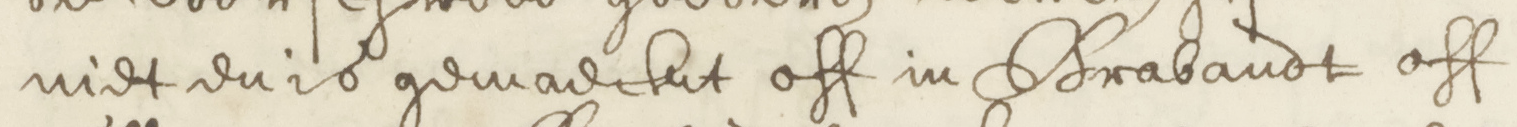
niet en is gemaeckt off in Brabandt off
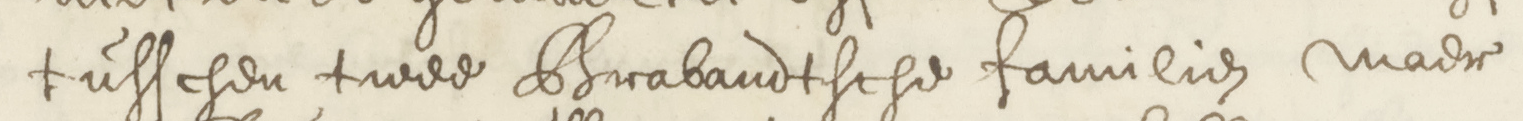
tusschen twee Brabandtsche familien maer
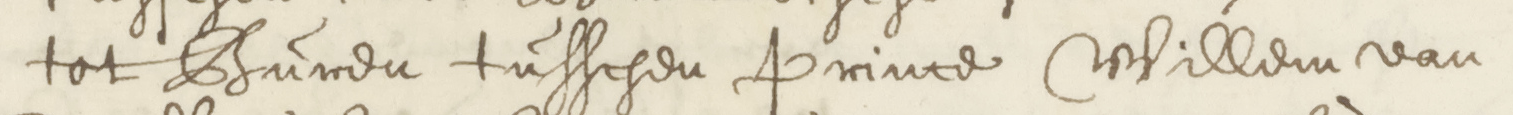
tot Buren tusschen Prince Willem van
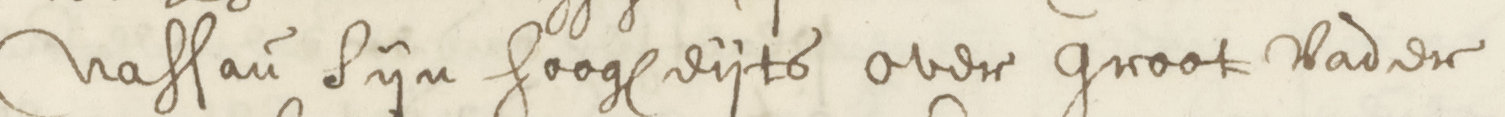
Nassau sijn hoogheijts over Groot Vader
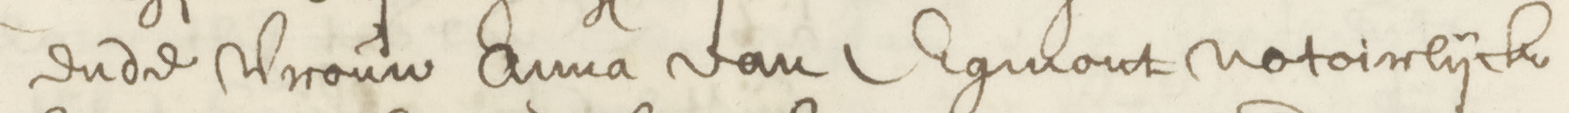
ende Vrouw Anna van Egmont notoirlijck
